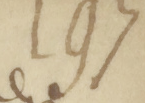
197
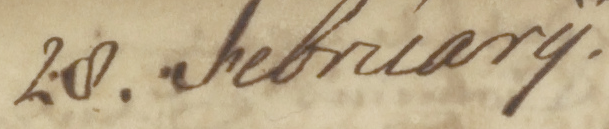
28. Februarij.
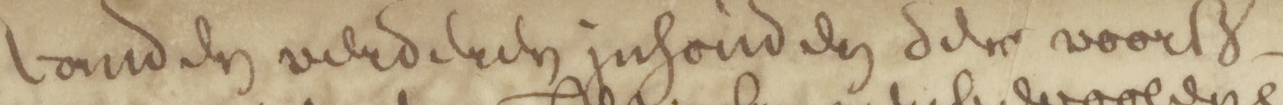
vanden verderen inhouden der voors
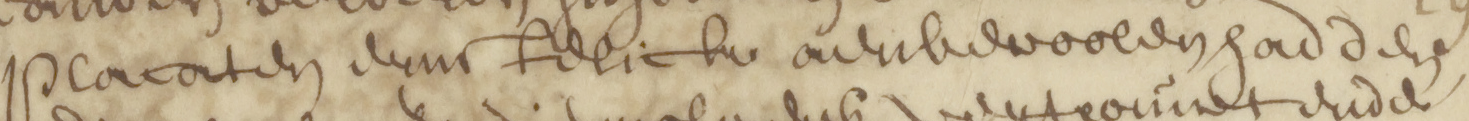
Placaten ernstelick aenbevoolen hadden,
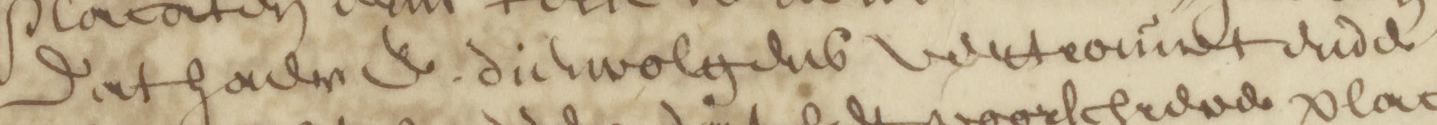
Dat haer E. dienvolgens vertrouwt ende
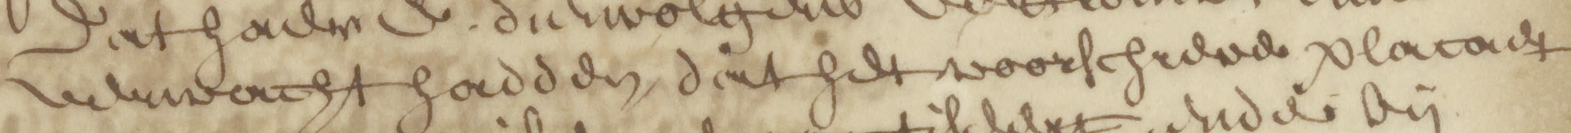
verwacht hadden, dat het voorschreve placaet
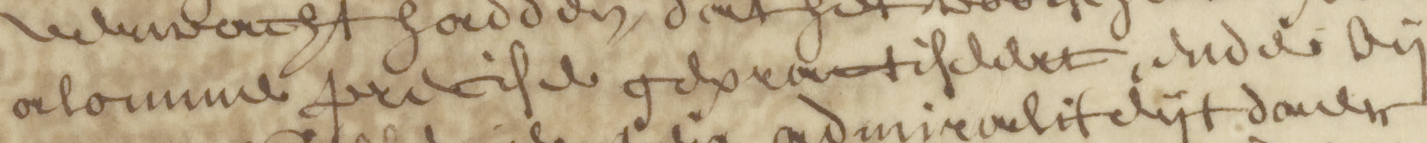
alomme precise gepractiseert ende bij
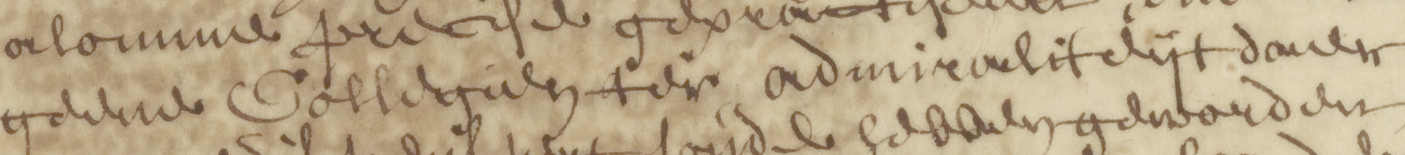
geene Collegien ter Admiraliteijt daer
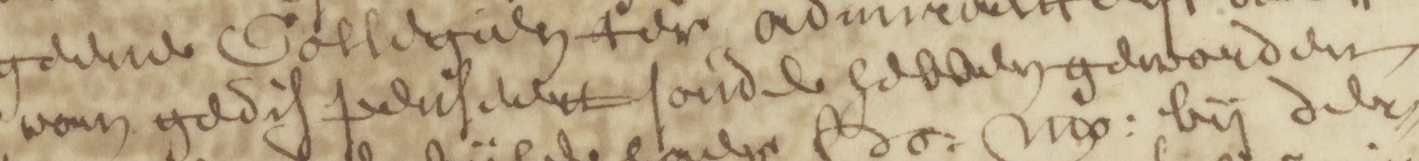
’van gedispenseert soude hebben geworden,
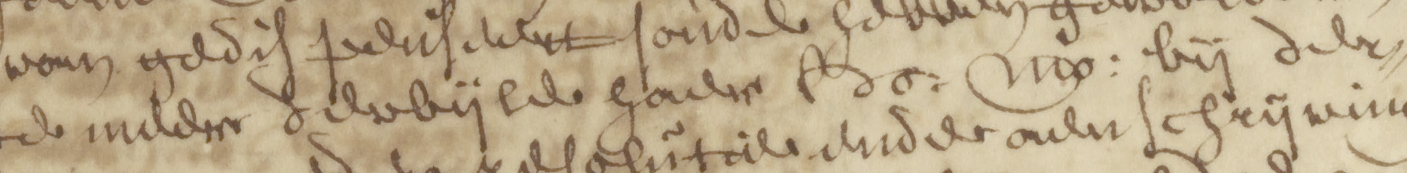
te meer dewijle haer Ho:Mo: bij der„
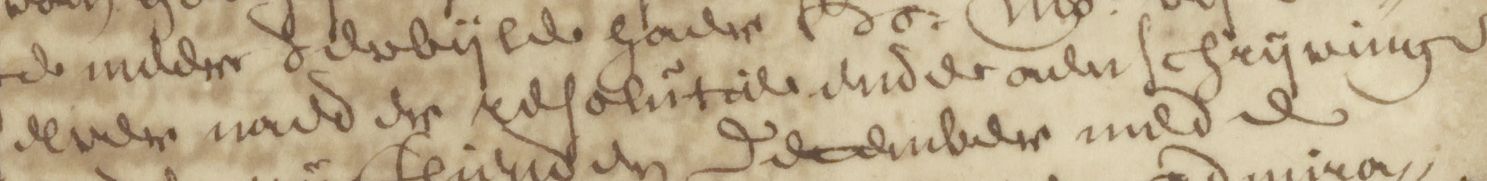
selven naeder resolutie ende aenschrijvinge
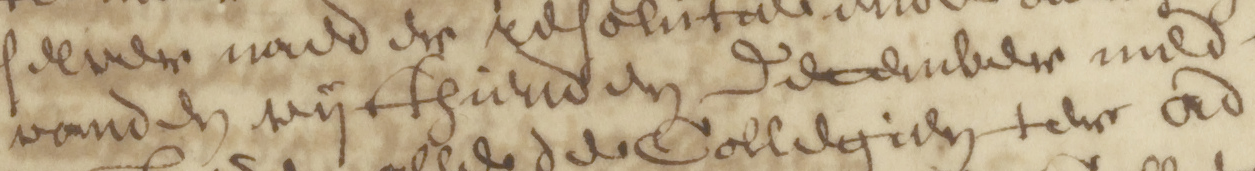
vanden vijfthienden December mede
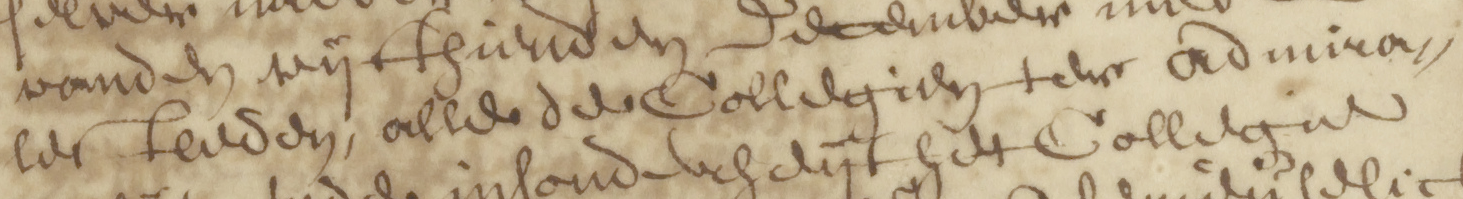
lestleden, alle de Collegien ter Admira„
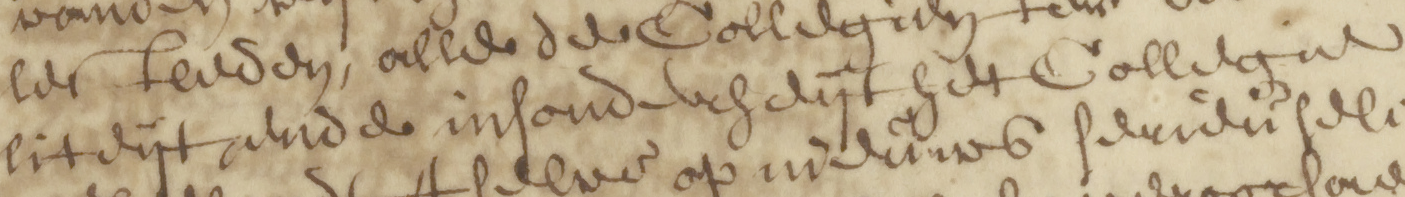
liteijt, ende insonderheijt het Collegie
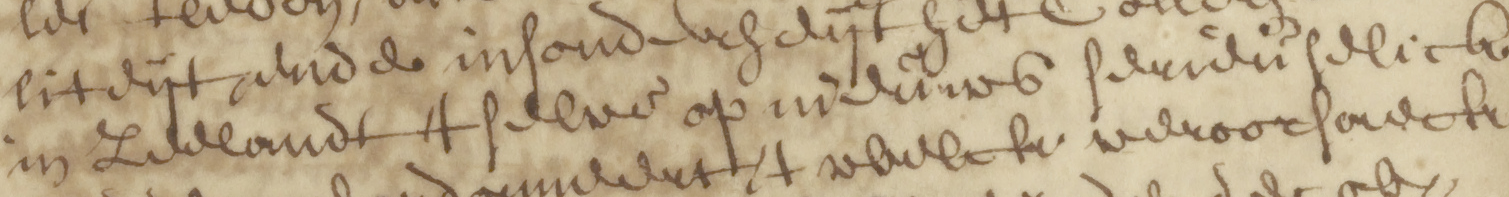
in Zeelandt 't selve op nieuws serieuselick
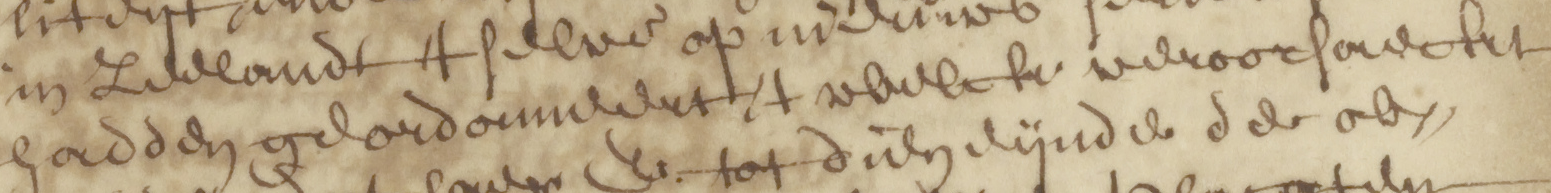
hadden geordonneert, ‛t welck veroorsaeckt
